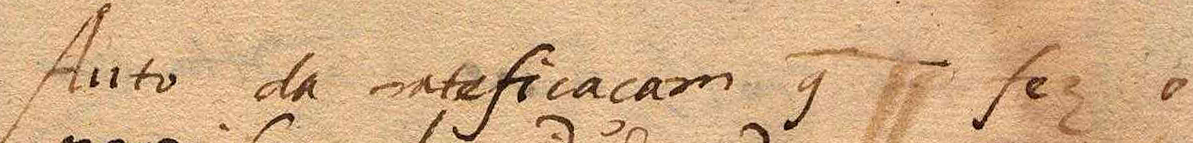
Auto da rateficaçam q̄ fez o
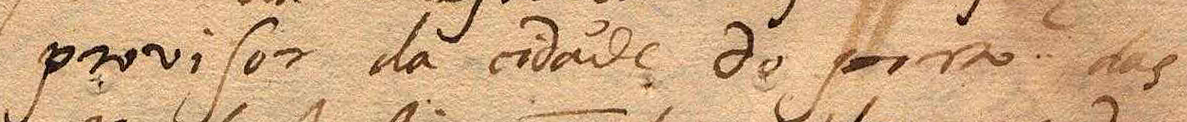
provisor da cidade do porto das
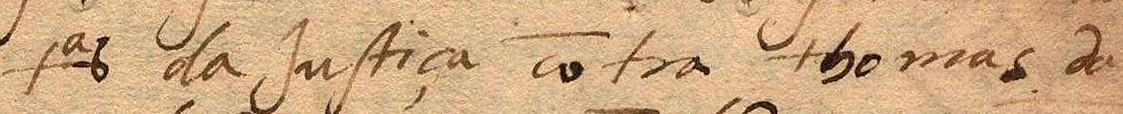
tas da Justiça c̄otra thomas da
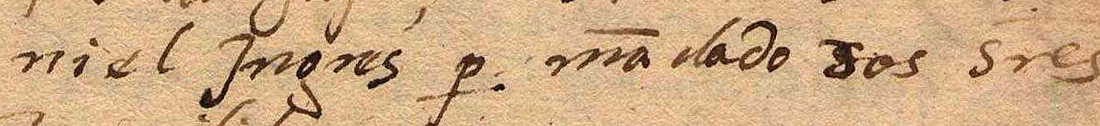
niel Jngres ꝑ mādado dos sr̄es
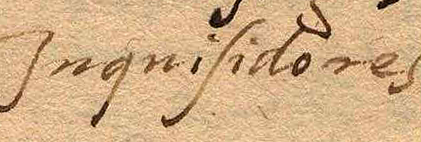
Jnquisidores
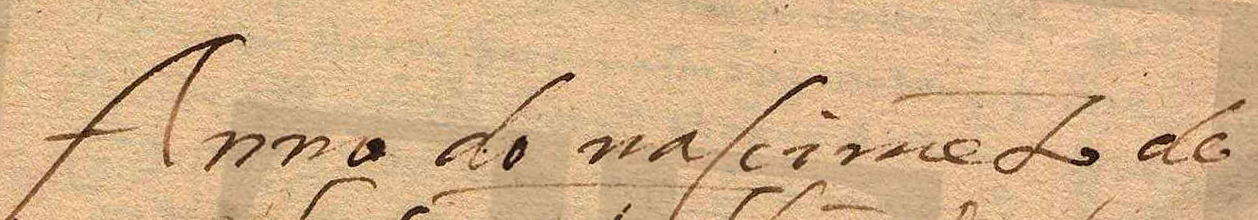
Anno do nascimēto de
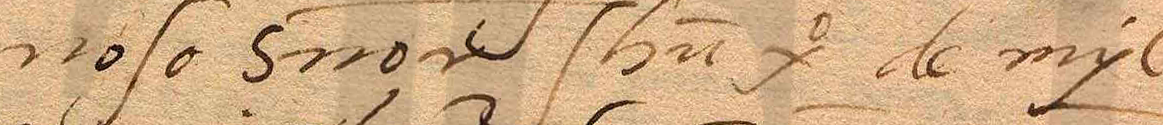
noso sn̄or Jhū xo de myl
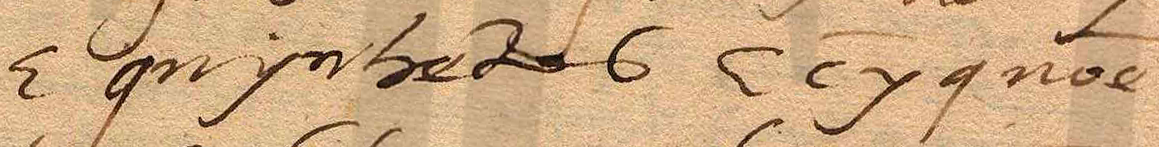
E quynhētos E cȳquoē
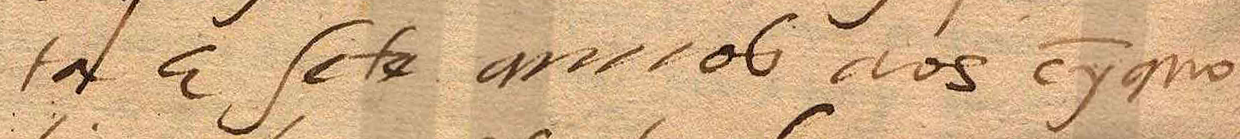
ta E sete annos aos c̄yquo
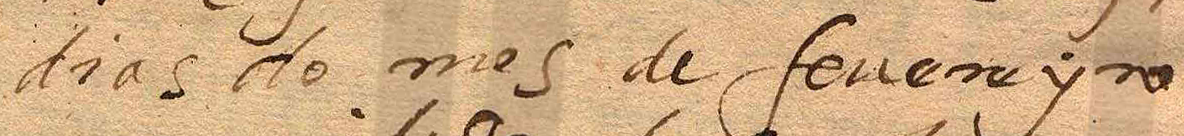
dias do mes de feuereyro
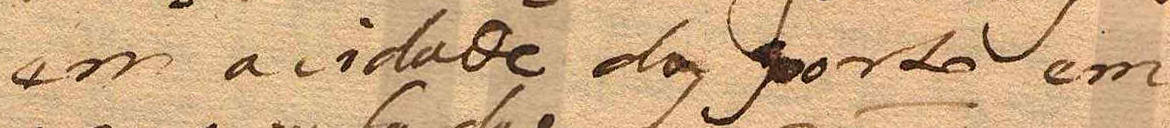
em a cidade do porto em
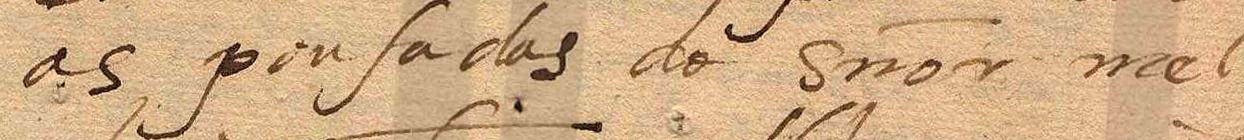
as pousadas do snōr mel
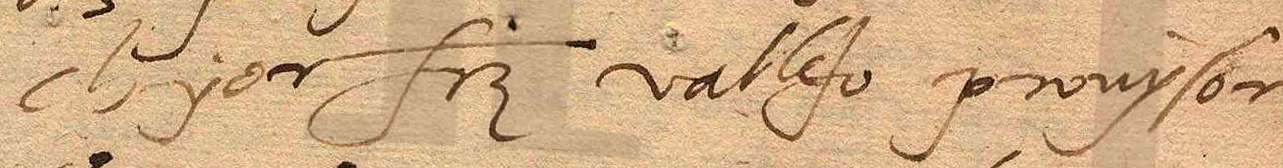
chyor f̄rz valleJo prouysor
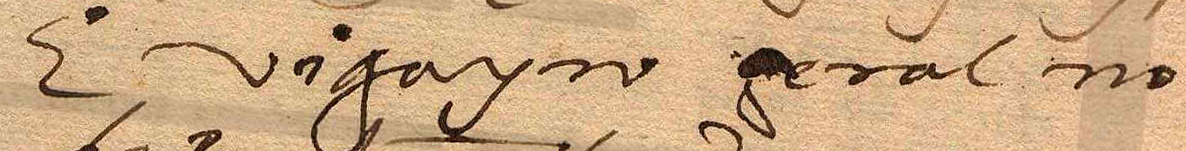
E vigayro geral no
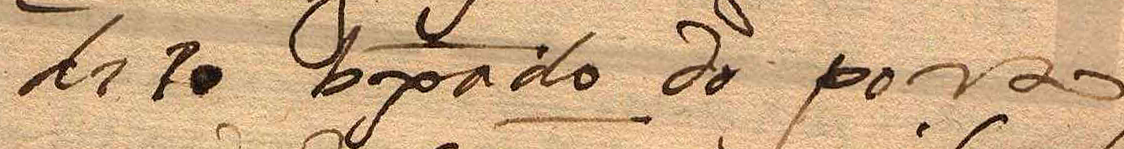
dito bp̄ado do porto
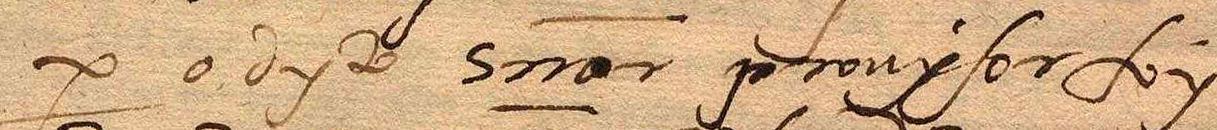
ꝑ o dyto sn̄or prouysor foy
